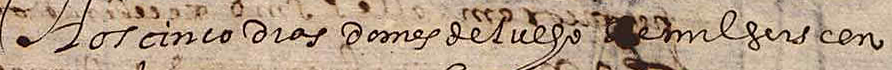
Aos cinco dias do mes de Julho de mil seicen
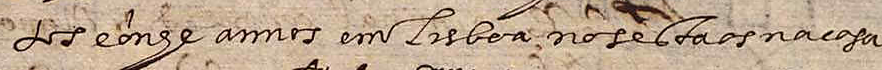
tos e onze annos em Lisboa nos estaos na casa
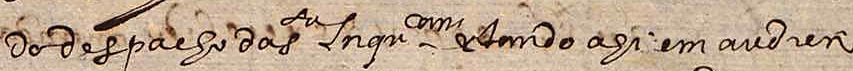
do despacho da Sta Jnqu.cam estando ahi em audien
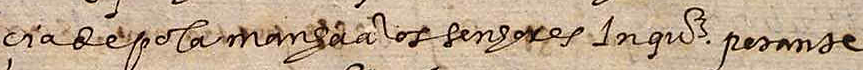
çia de pola manha aos senhores Jnqu.s perante
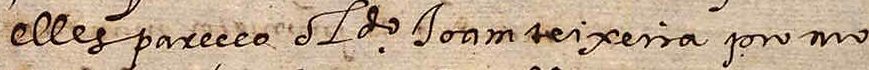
elles pareçeo o Ldo. Joam teixeira promo
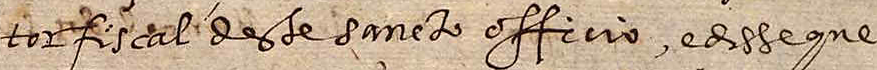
tor fiscal deste sancto officio, e disse que
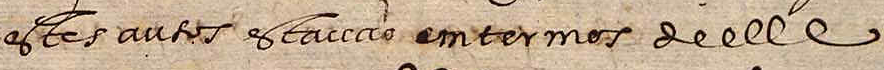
estes autos estavão em termos de elle
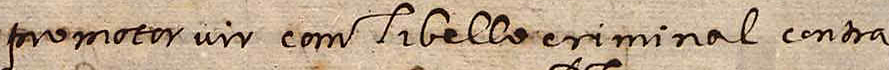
promotor vir com libello criminal contra
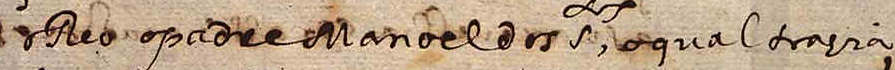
o Reo o padre Manoel dos Stos, o qual trazia
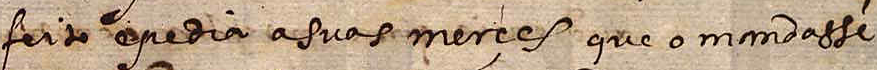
feito o pedia a suas merçes que o mandassē
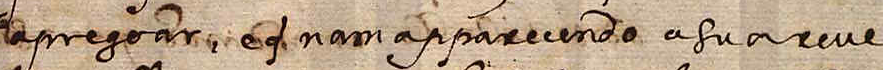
apregoar, e q̄ nam as parecendo a sua reve
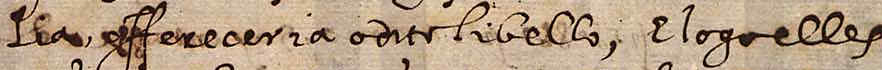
lia, offerecer ia o dito libello, e logo elles
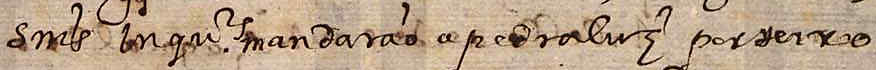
snr̄s jnqurs mandarão a pedralvrz̄ porteiro
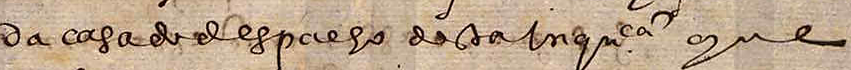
da casa do despacho desta inqu.cã que
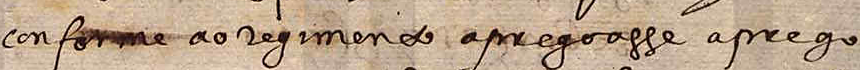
conforme ao regimento apregoasse aprego
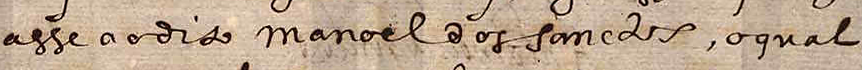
asse ao dito manoel dos sanctos, o qual
